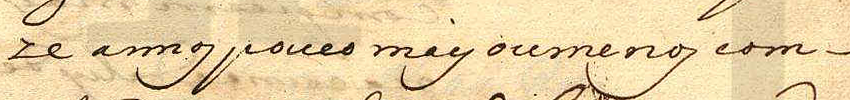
ze annos oouco mais ou menos com
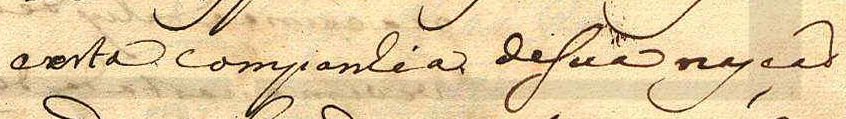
certa companhia de sua nasçaõ
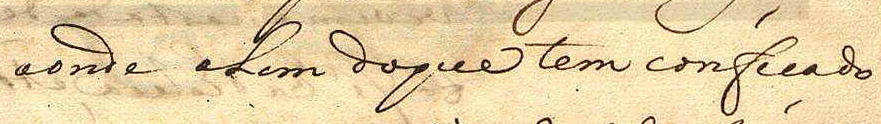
aonde aLem do que tem confeçado
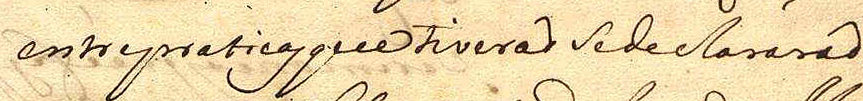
entre praticas que tiveraõ se declararaõ
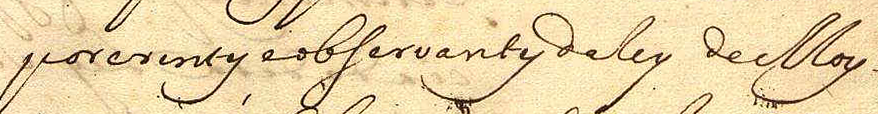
por crentes e observantes da ley de Moy
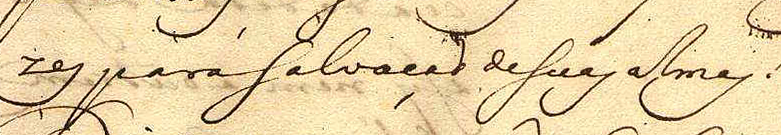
zes para salvaçaõ de suas almas?
